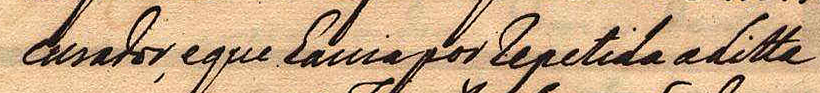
curador, e que hauia por Repetida a ditta
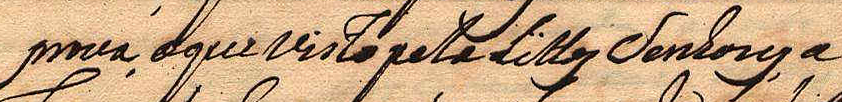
prova, o que visto pelo dittos Senhores, a
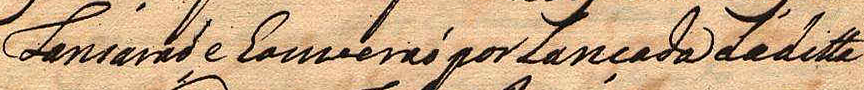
Lansaraõ, e houveraõ por Lançada da ditta
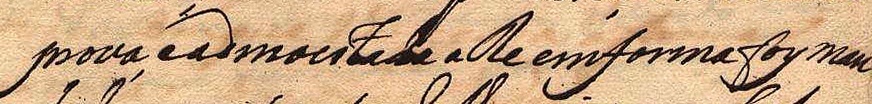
prova, e admoestada a Re em forma foy man
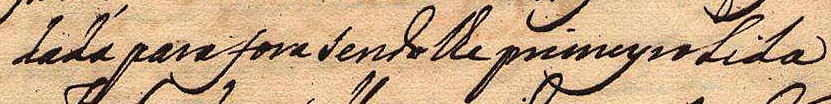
dada para fora sendolhe primeyro Lida
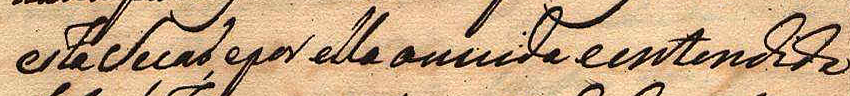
esta Seçaõ, e por ella ouuida e entendida
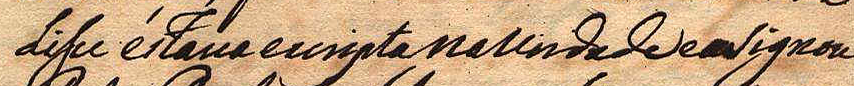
disse estaua escripta na verdade e asignou
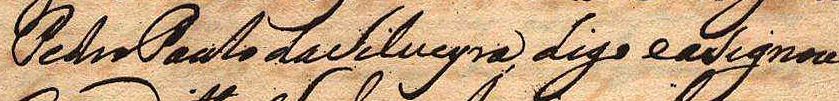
Pedro Paulo da Silueyra, digo e asignou
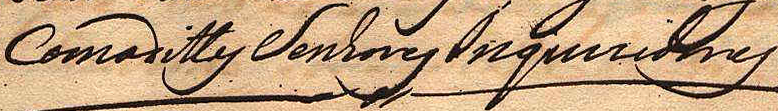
Com o dittos Senhores Inquizidores
